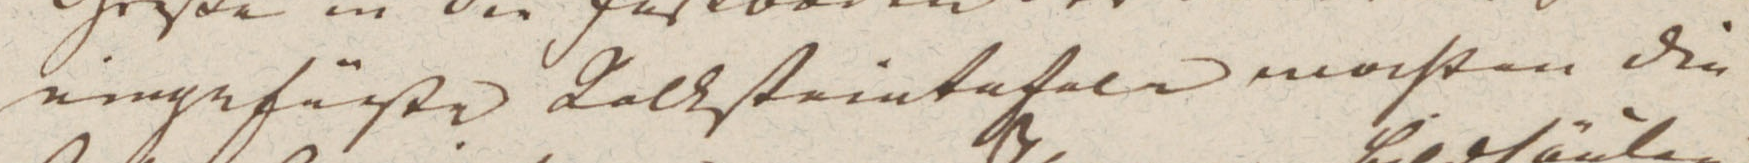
eingefügte Kalksteintafeln mochten die
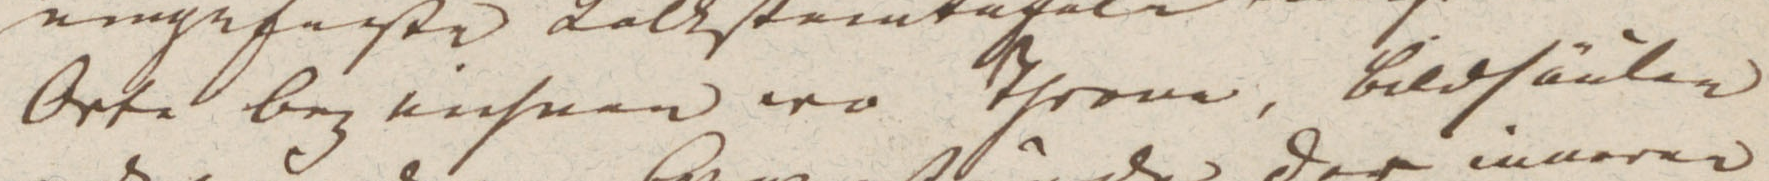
Orte eichnen wo Throne, Bildsäulen
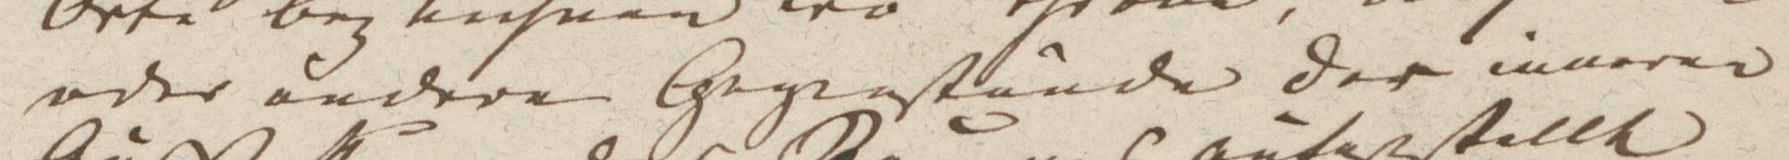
oder andere Gegenstände der inneren
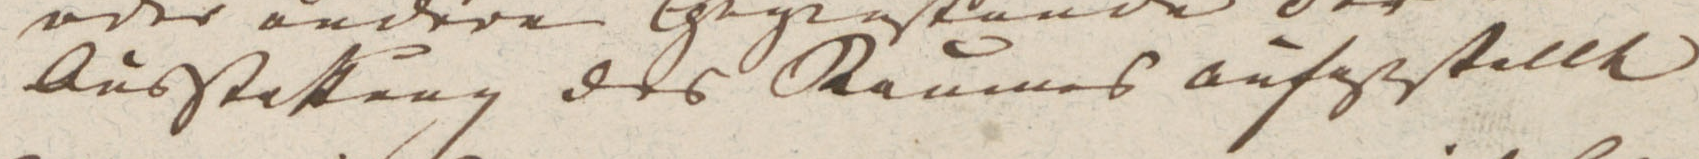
Ausstattung des Raumes aufgestellt
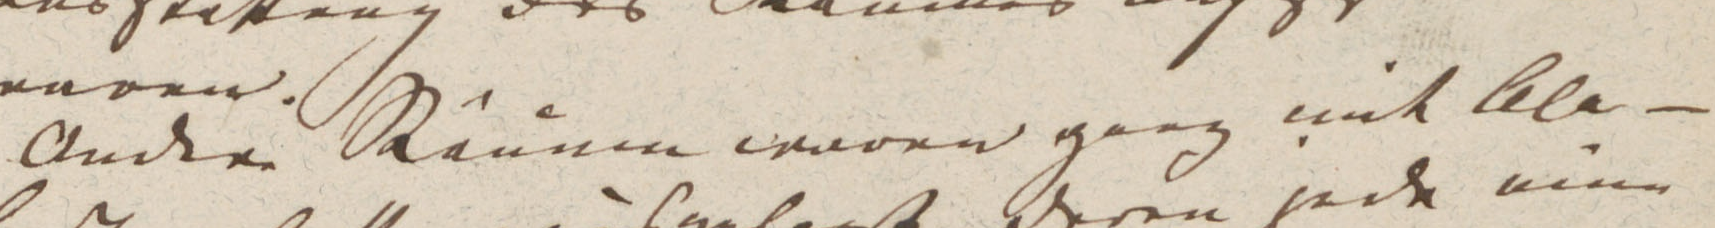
Andere Räume waren ganz mit Ala-
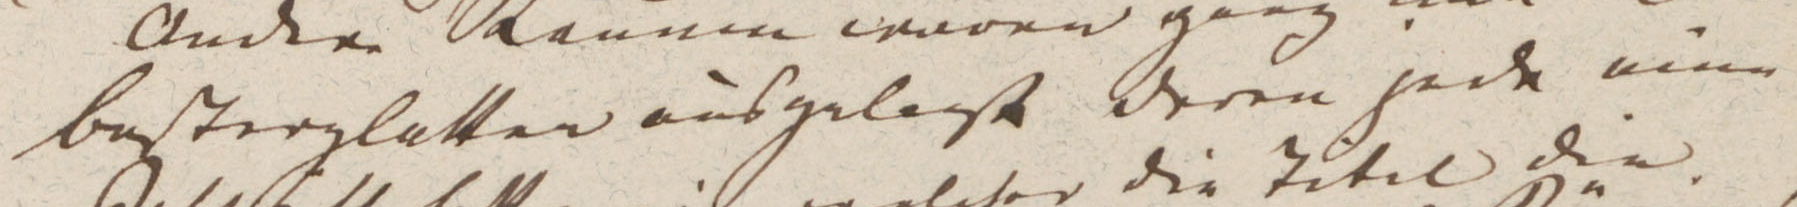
basterplatten ausgelegt deren jede eine
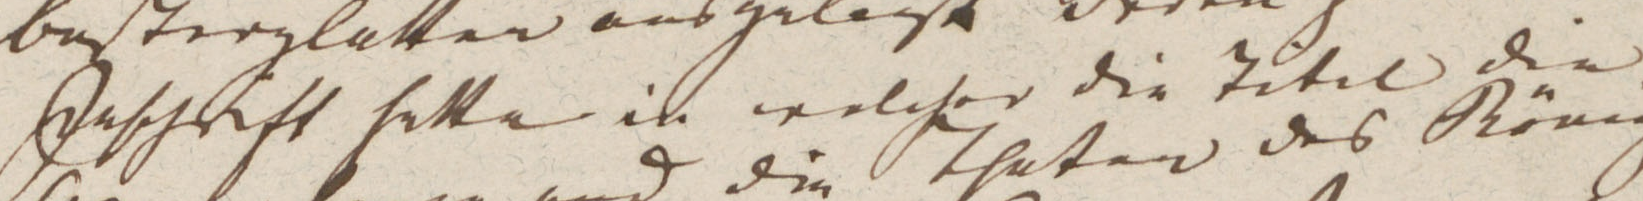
Inschrift hatte in welcher die Titel die
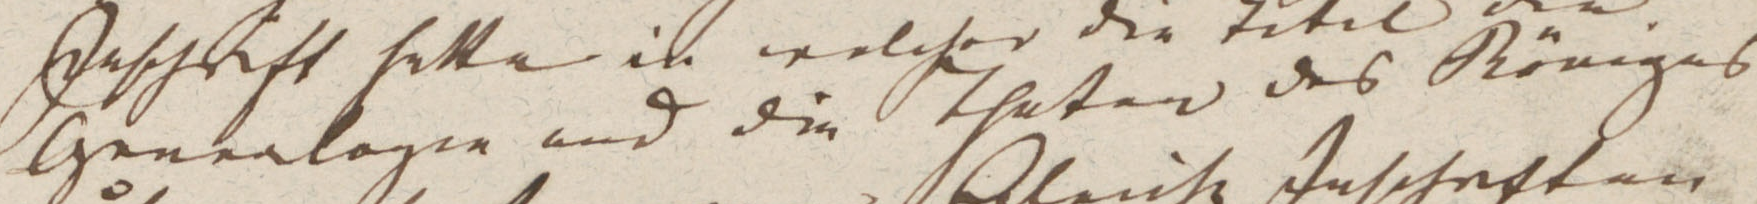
Genealogie und die Thaten des Königes
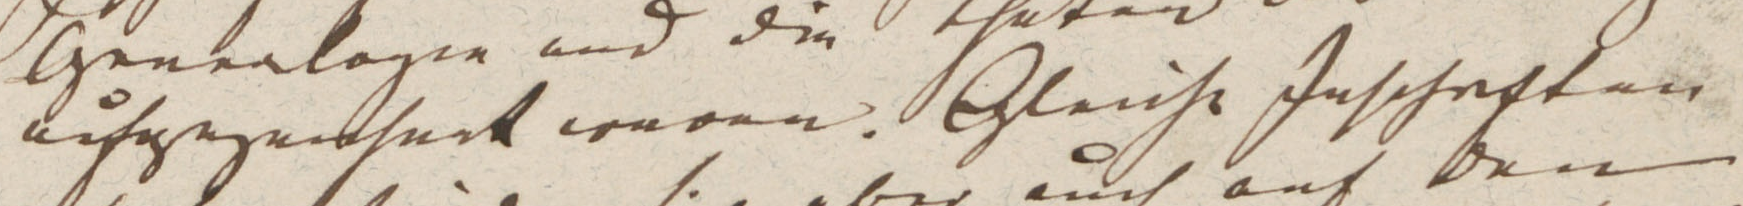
aufgezeichnet waren. Gleiche Inschriften
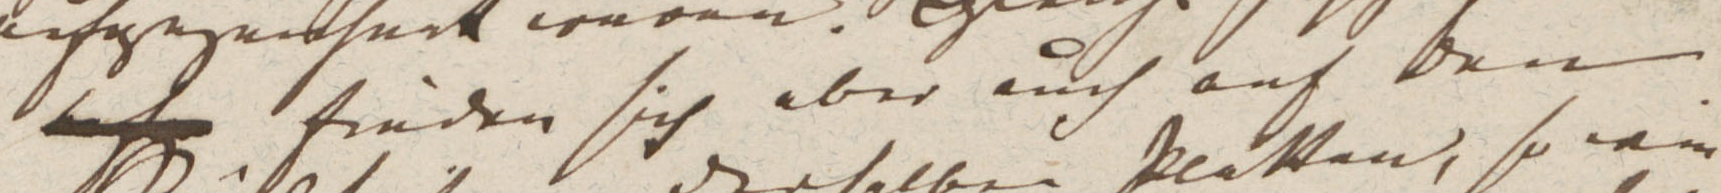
h finden sich aber auch auf den
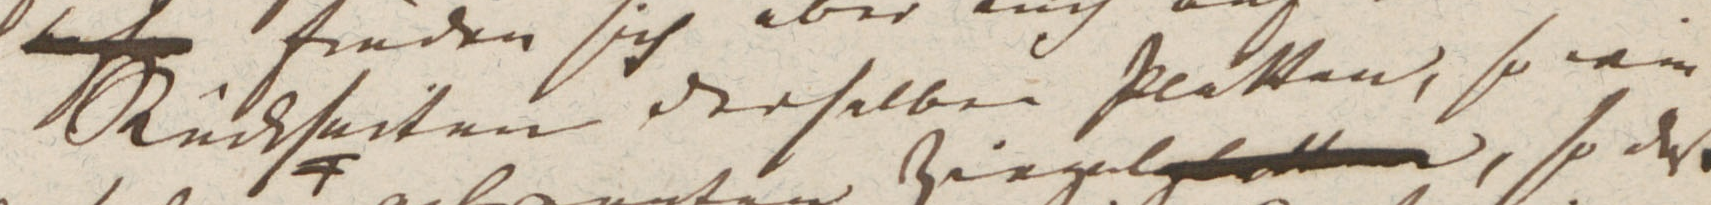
Rückseiten derselben Platten, so wie
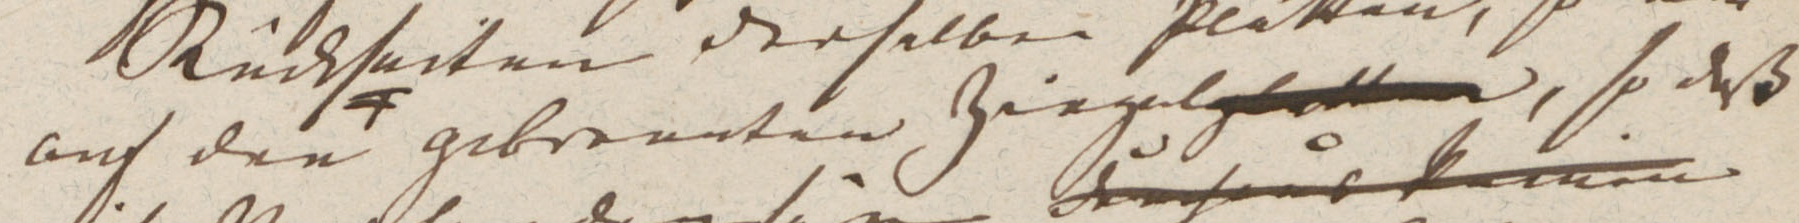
auf den % gebrannten Ziegelplatten, so dass
